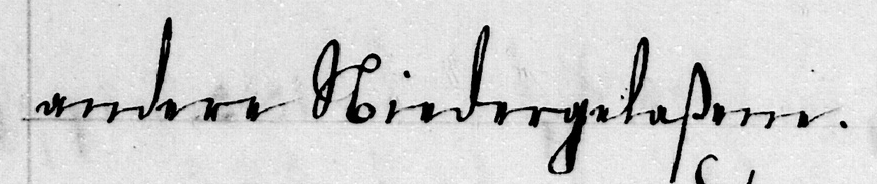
andere Niedergelaßene.
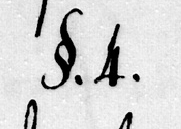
§. 4.
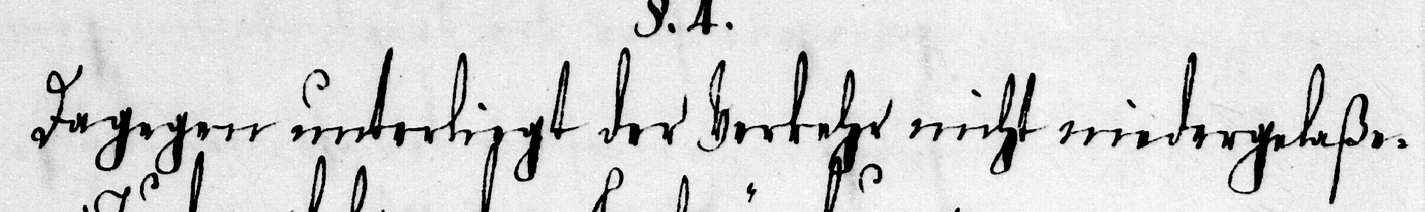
Dagegen unterliegt der Verkehr nicht niedergelaße¬
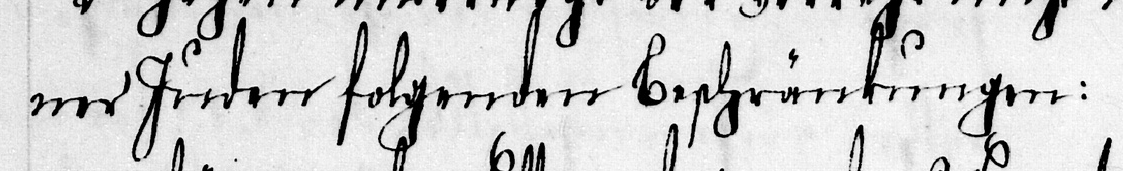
ner Juden folgenden Beschränkungen:
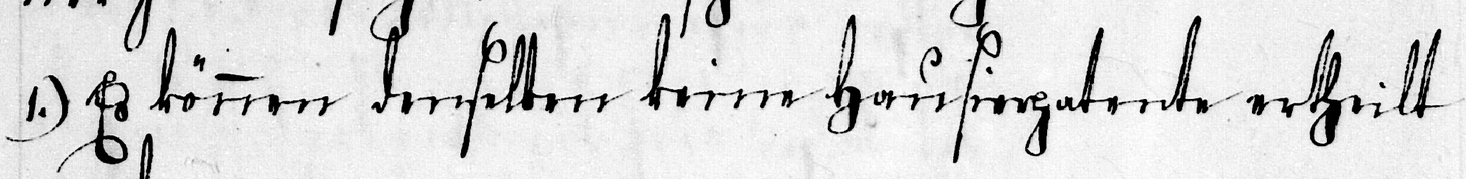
1.) Es können denselben keine Hausierpatente ertheilt
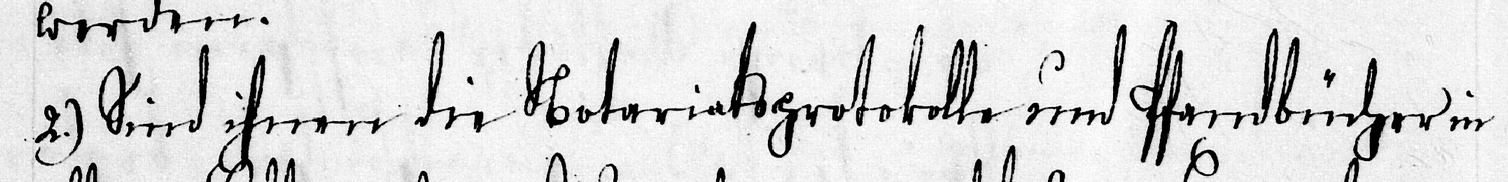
2.) Sind ihnen die Notariatsprotokolle und Pfandbücher in
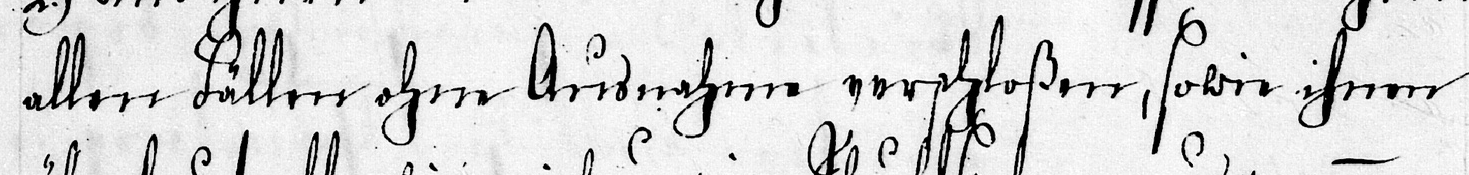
allen Fällen ohne Ausnahme verschloßen, sowie ihnen
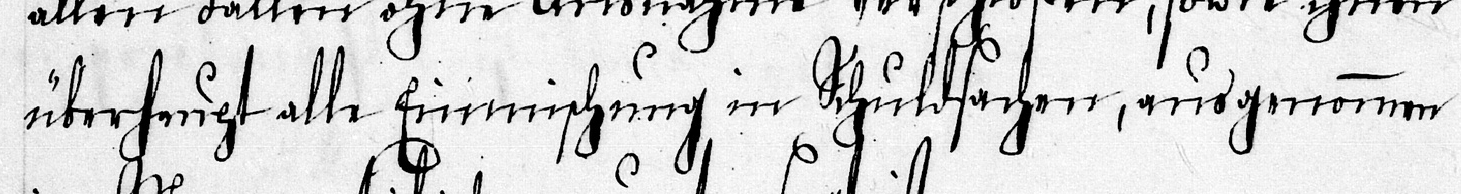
überhaupt alle Einmischung in Schuldsachen, ausgenommen
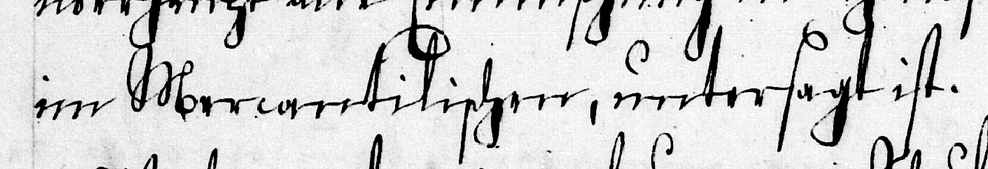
im Mercantilischen, untersagt ist.
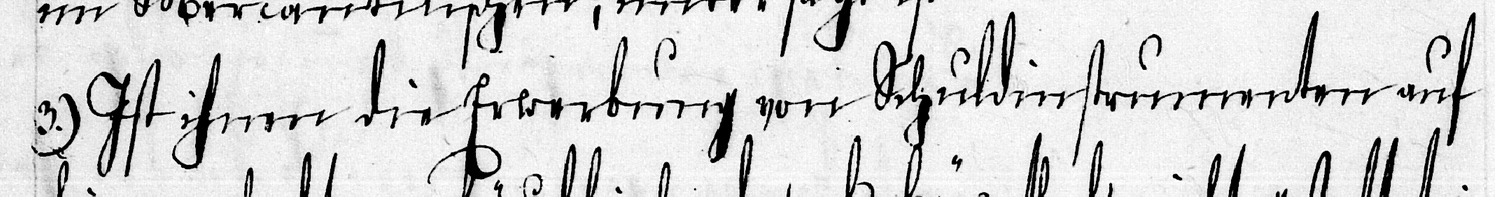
3.) Ist ihnen die Erwerbung von Schuldinstrumenten auf
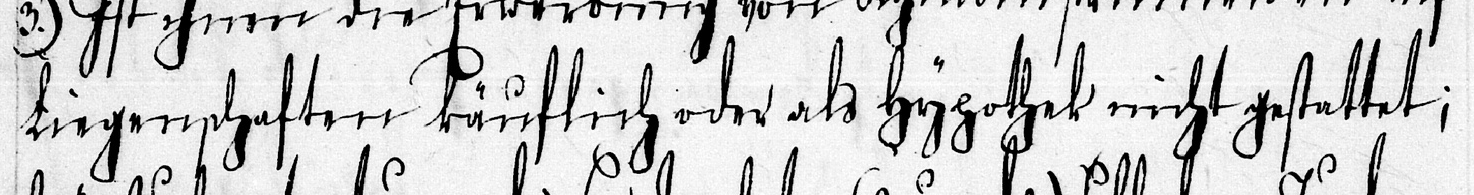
Liegenschaften käuflich oder als Hypothek nicht gestattet;
